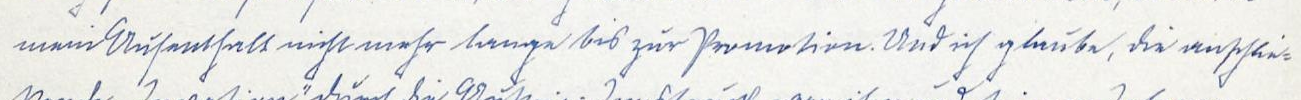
mein Aufenthalt nicht mehr lange bis zur Promotion. Und ich glaube, die anschlie-
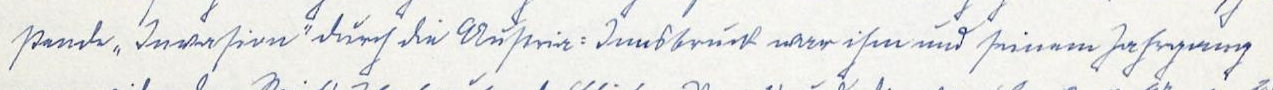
ßende „Invasion" durch die Austria:-Innsbruck war ihm und seinem Jahrgang
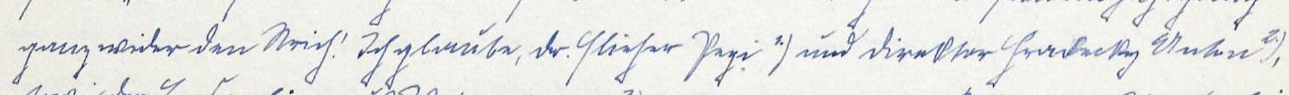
ganz wieder den Strich! Ich glaube, Dr. Flieher Pepi 1) und Direktor Hradecky Anton 2)
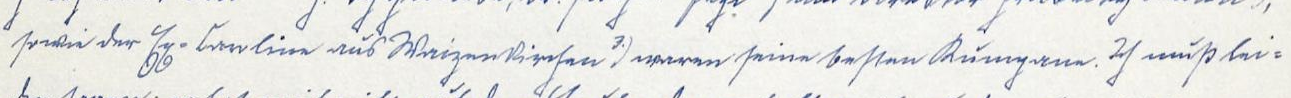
sowie der Ex- Caroline aus Waizenkirchen 3) waren seine besten Kumpane. Ich muß lei-
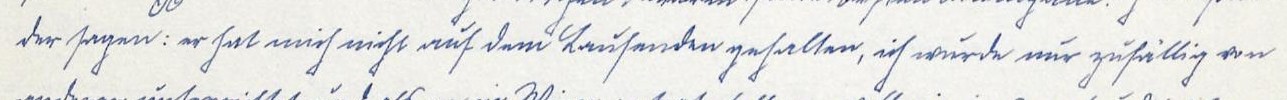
der sagen: er hat mich nicht auf dem Laufenden gehalten, ich wurde nur zufällig von
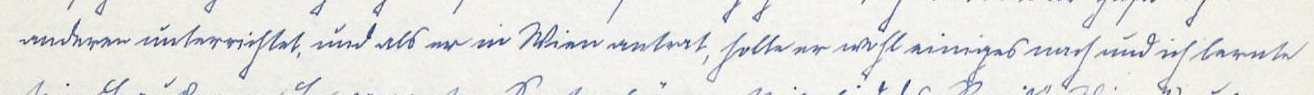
anderen unterrichtet, und als er in Wien antrat, holte er wohl einiges nach und ich lernte
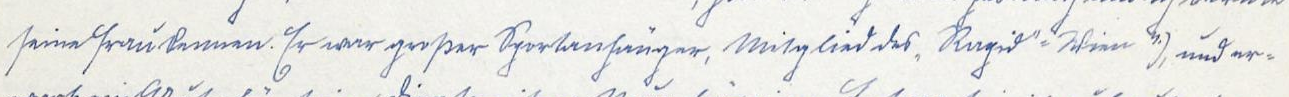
seine Frau kennen. Er war großer Sportanhänger, Mitglied des "Rapid"-Wien 3) und er-
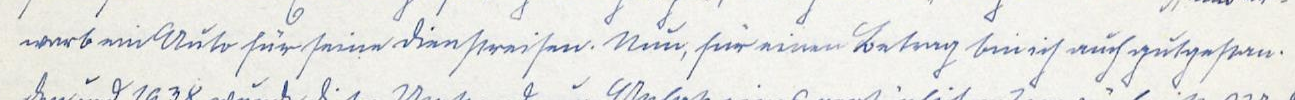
warb ein Auto für seine Dienstreisen. Nun, für einen Beitrag bin ich auch gutgestan-
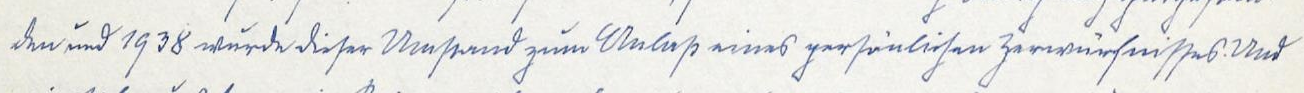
den und 1938 wurde dieser Umstand zum Anlaß eines persönlichen Zerwürfnisses und
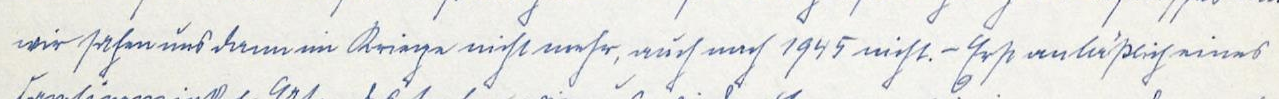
wir sahen uns dann im Kriege nicht mehr, auch nach 1945 nicht. - Erst anlässlich eines
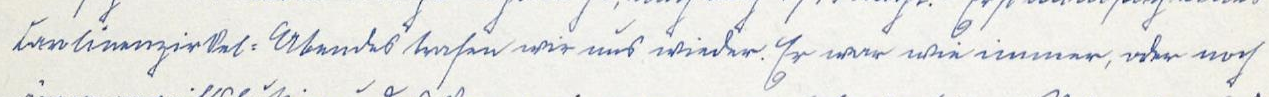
Carolinenzirkel- Abendes trafen wir uns wieder. Er war wie immer, oder noch
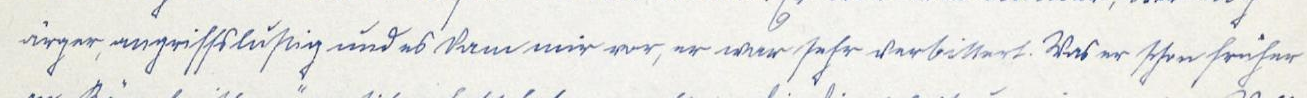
ärger, angriffslustig, und es kam mir vor, er war sehr verbittert. Was er schon früher
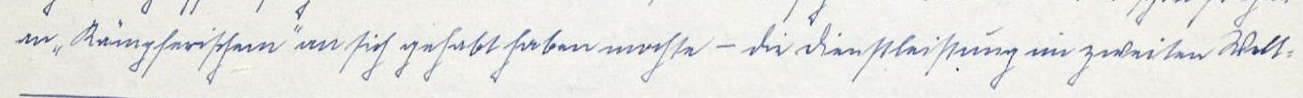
an „Kämpferischen“ an sich gehabt haben mochte - die Dienstleistung im zweiten Welt-
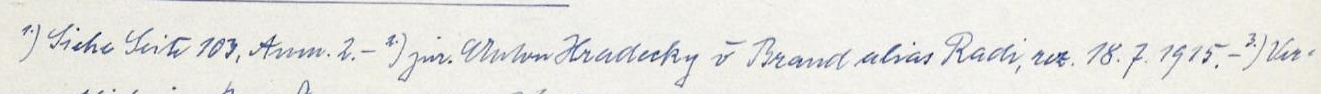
1) Siehe Seite 103, Anm.- 2. ) iur. Anton Hradecky v/o Brand alias Radi, rez. 18. 7.1915. 3) Ver-
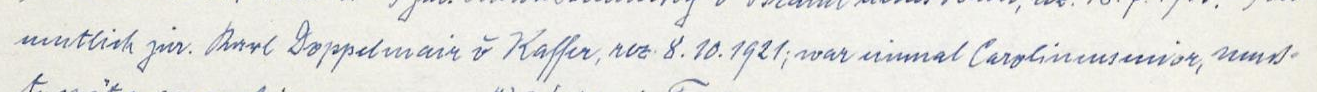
mentlich iur. Karl Doppelmair v/0 Kaffer, rez. 8. 101921, war einmal Carolinensenior, muß-
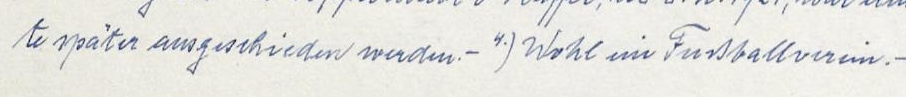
te später ausgeschieden werden.- 2) Wohl ein Fußballverein.
